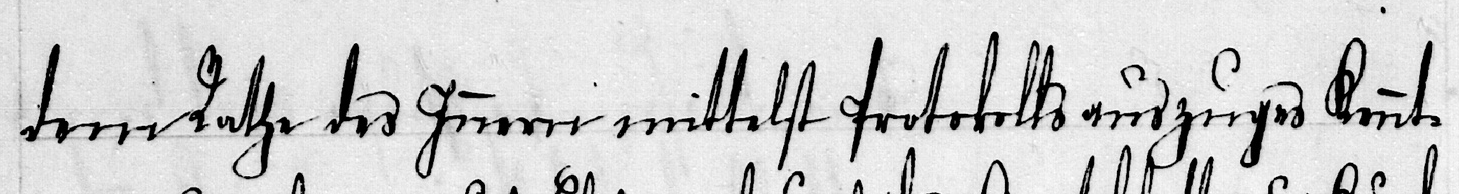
dem Rathe des Innern mittelst Protokollsauszuges Kennt¬
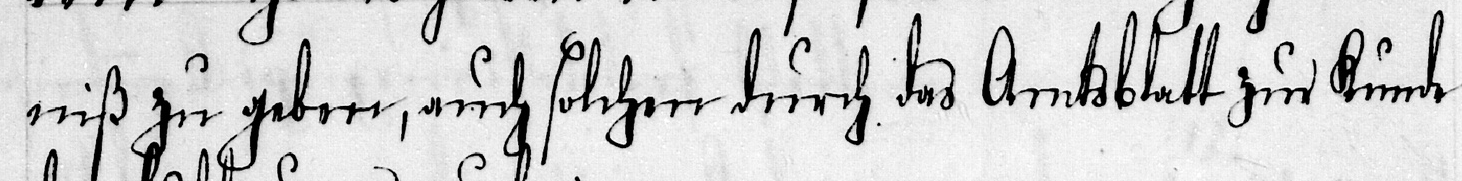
niß zu geben, auch solchen durch das Amtsblatt zur Kunde
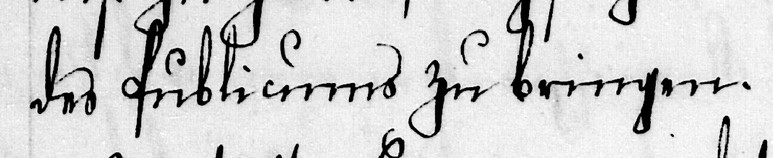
des Publicums zu bringen.
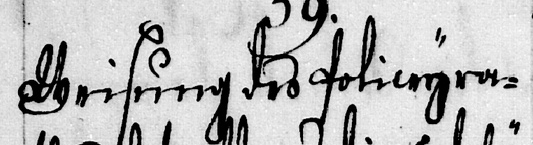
theilung des Obergeric¬
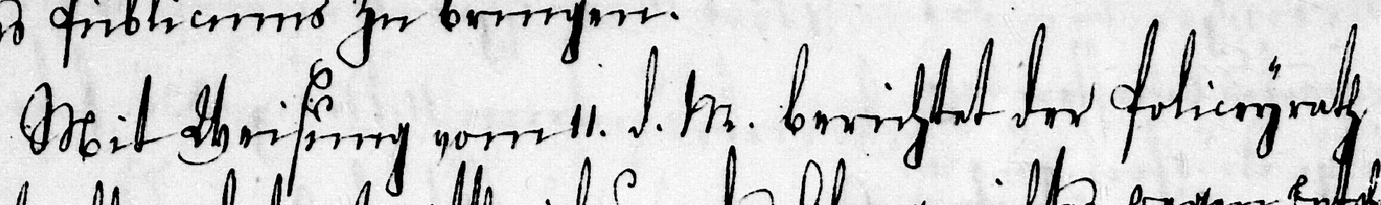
Mit Weisung vom 11. d. M. berichtet der Policeyrath
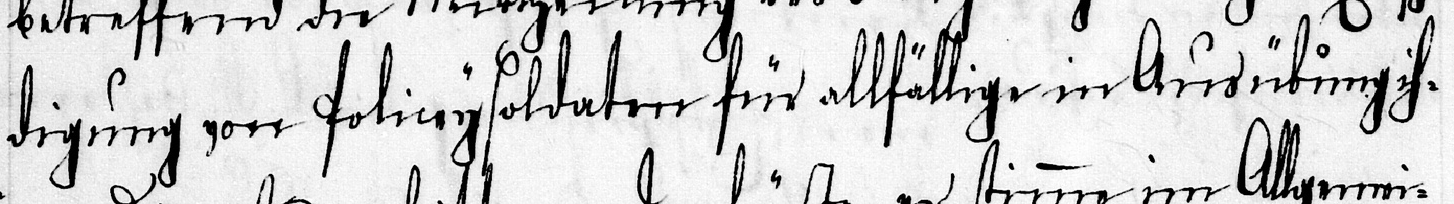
digung von Policeysoldaten für allfällige in Ausübung ih¬
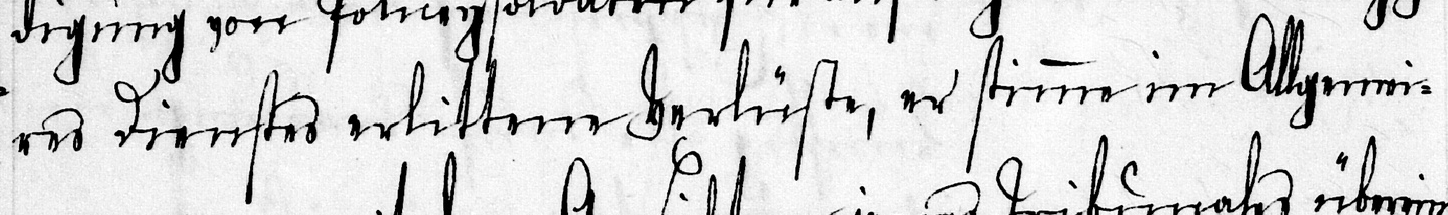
res Dienstes erlittenen Verluste, er stimme im Allgemei¬
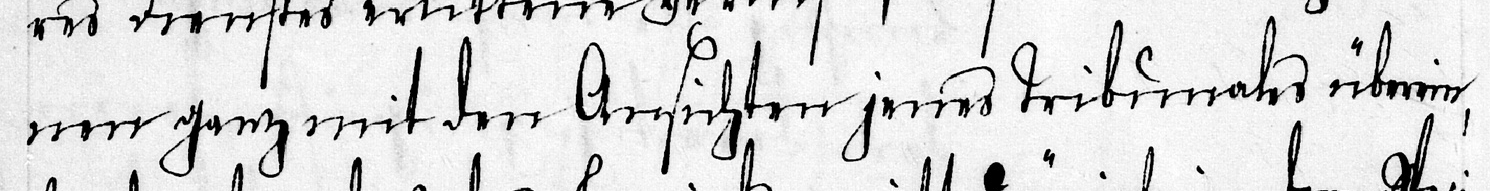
nen ganz mit den Ansichten jenes Tribunales überein,
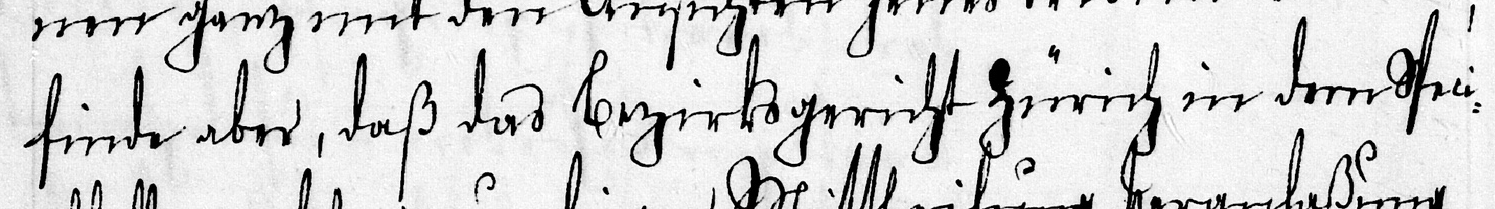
finde aber, daß das Bezirksgericht Zürich in dem Spec¬
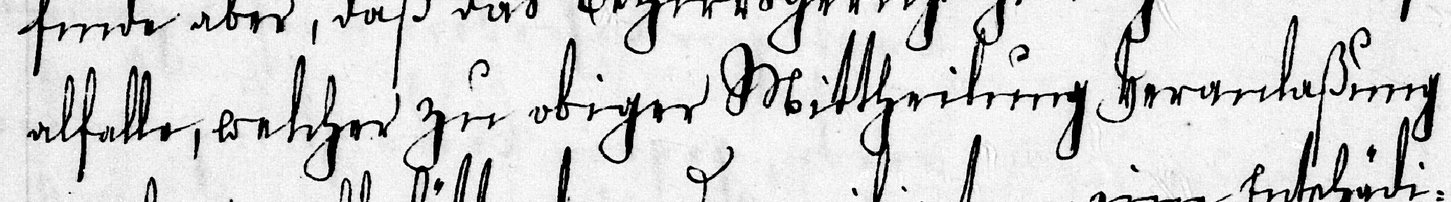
ialfalle, welcher zu obiger Mittheilung Veranlaßung
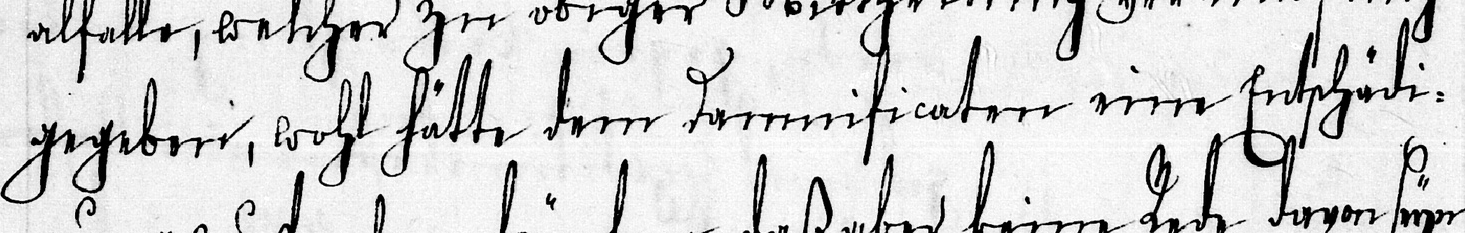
gegeben, wohl hätte dem Damnificaten eine Entschädi¬
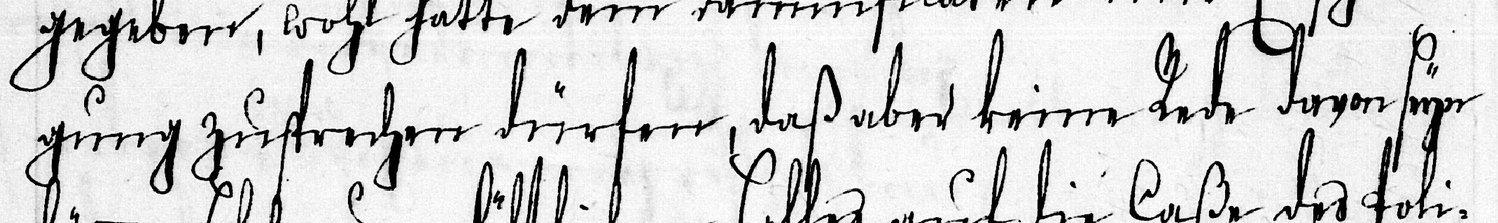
gung zusprechen dürfen, daß aber keine Rede davon seyn
